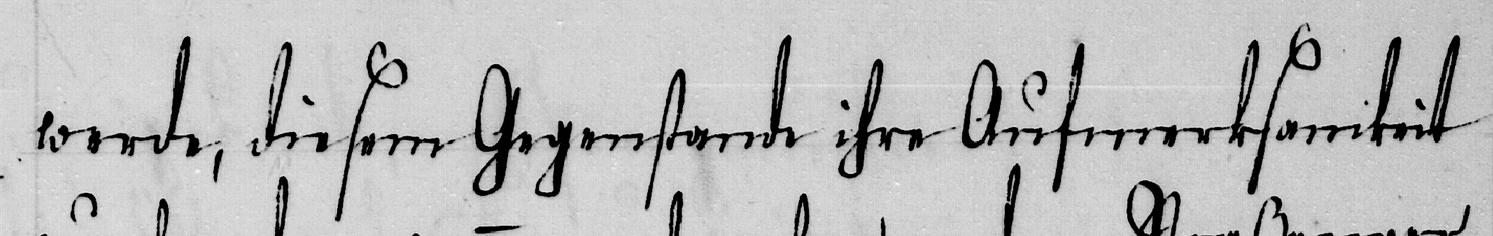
werde, diesem Gegenstande ihre Aufmerksamkeit
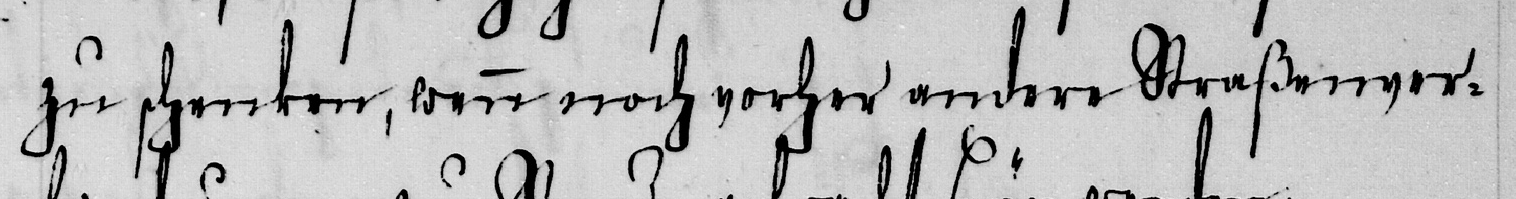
zu schenken, wenn noch vorher andere Straßenver¬
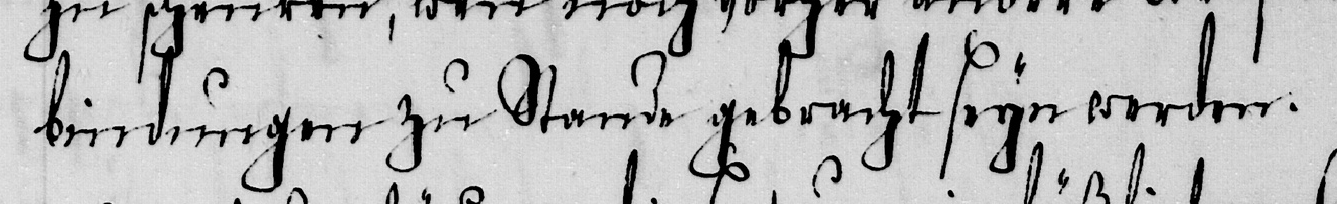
bindungen zu Stande gebracht seyn werden.
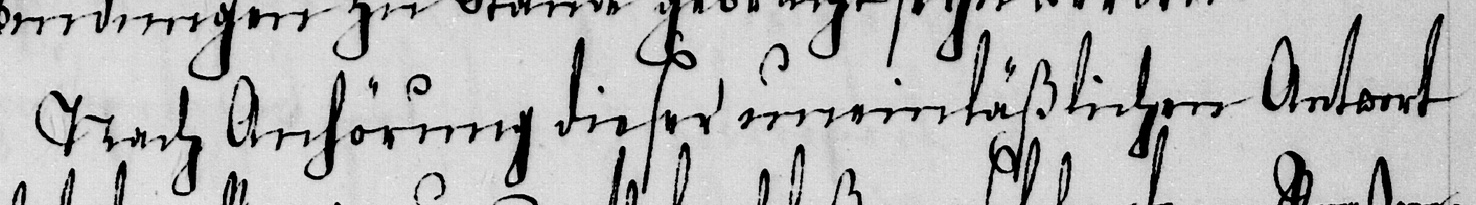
Nach Anhörung dieser uneinläßlichen Antwort
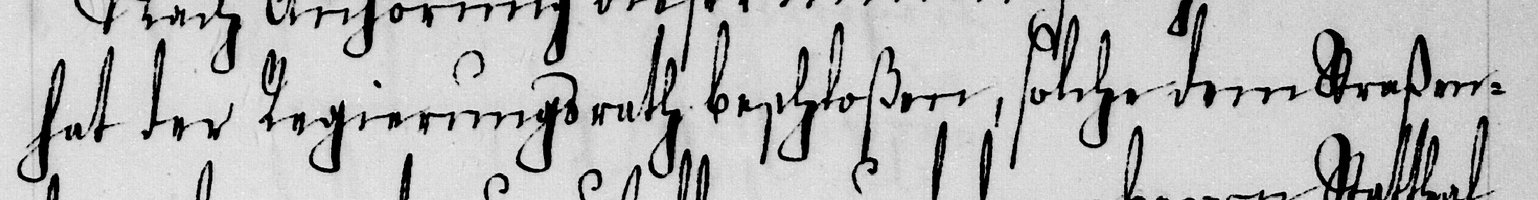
hat der Regierungsrath beschloßen, solche dem Straßen¬
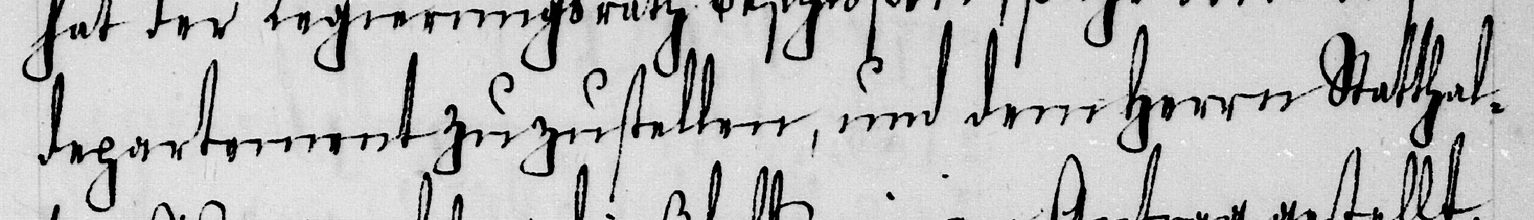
departement zuzustellen, und dem Herrn Stattha¬
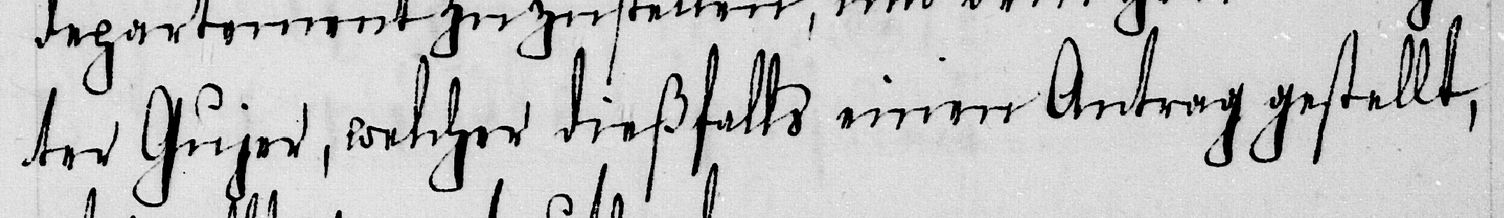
lter Gujer, welcher dießfalls einen Antrag gestellt,
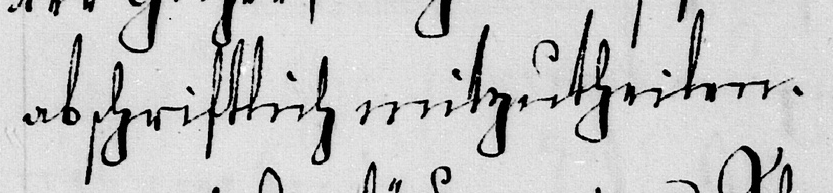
abschriftlich mitzutheilen.
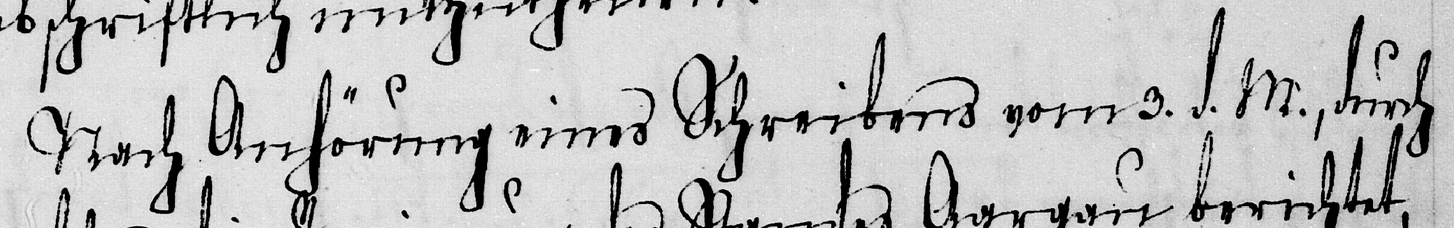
Nach Anhörung eines Schreibens vom 3. d. M., durch
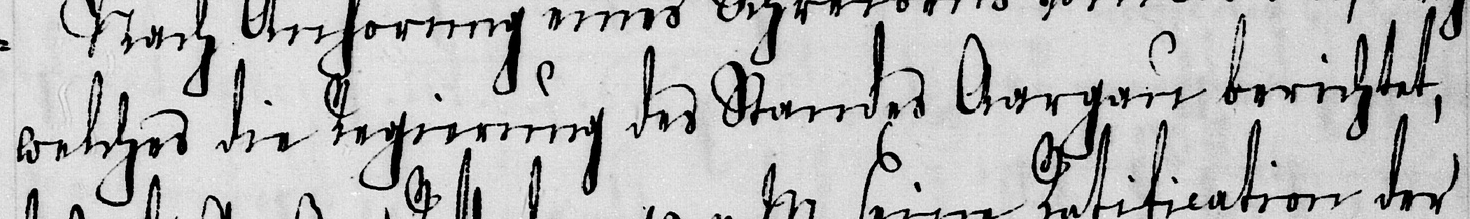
welches die Regierung des Standes Aargau berichtet,
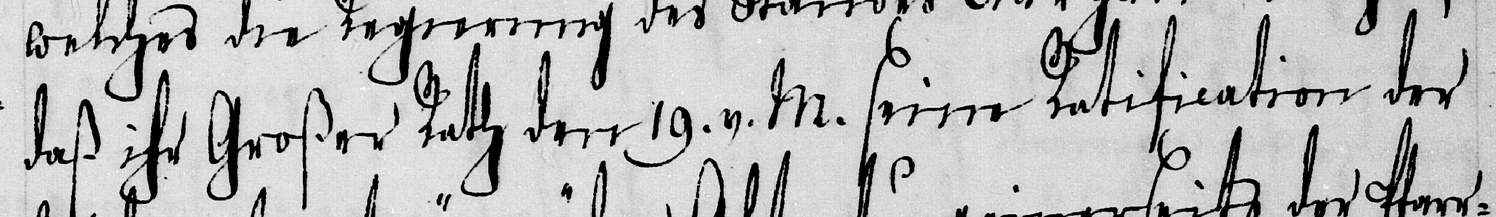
daß ihr Großer Rath den 19. v. M. seine Ratification der
